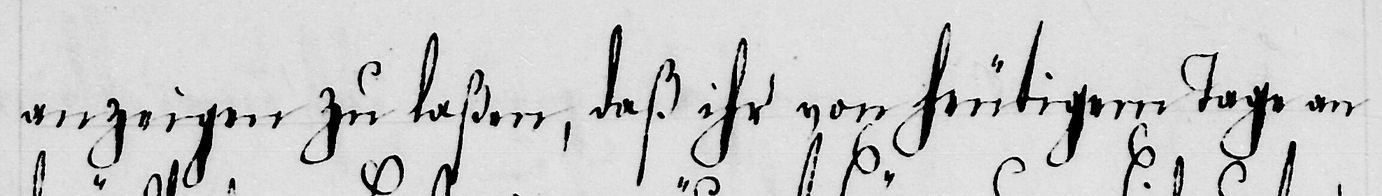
anzeigen zu laßen, daß ihr von heutigem Tage an
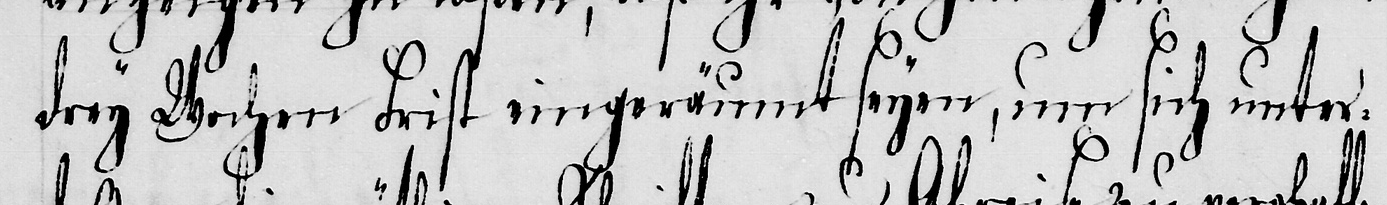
drey Wochen Frist eingeräumt seyen, um sich unter¬
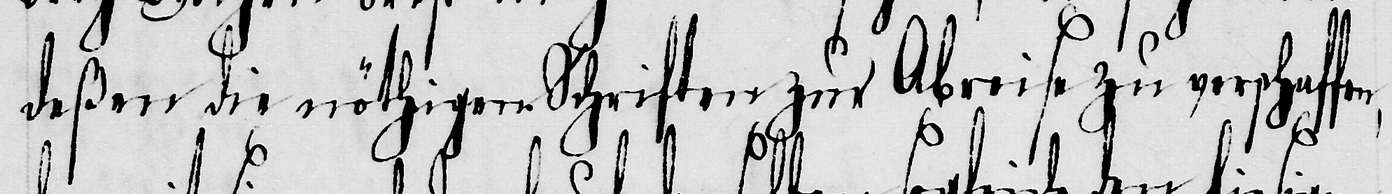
deßen die nöthigen Schriften zur Abreise zu verschaf¬
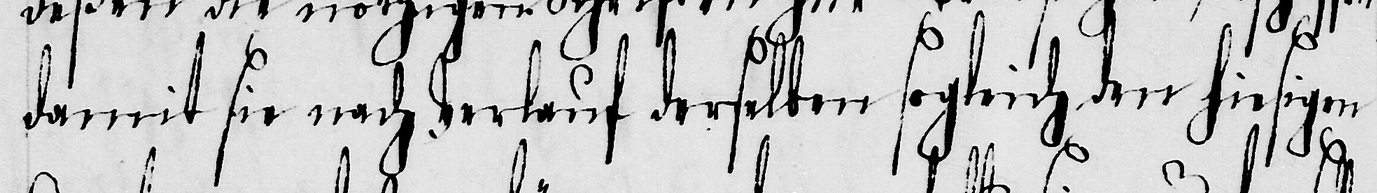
damit sie nach Verlauf derselben sogleich den hiesigen
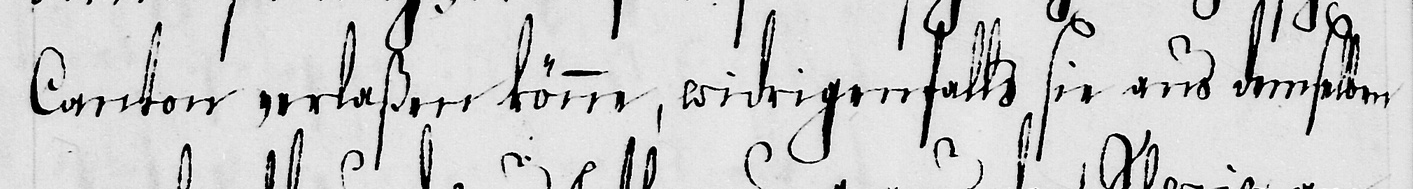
Canton verlaßen könne, widirgenfalls sie aus demselben
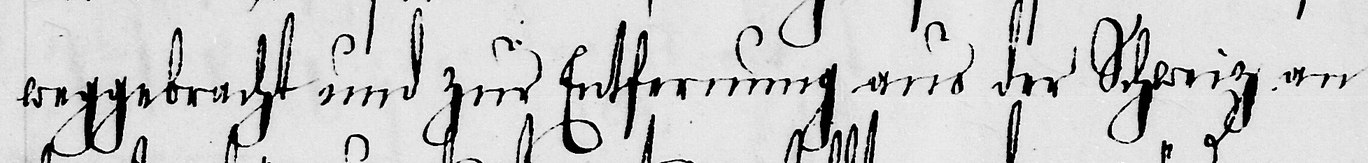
weggebracht und zur Enfernung aus der Schweiz an
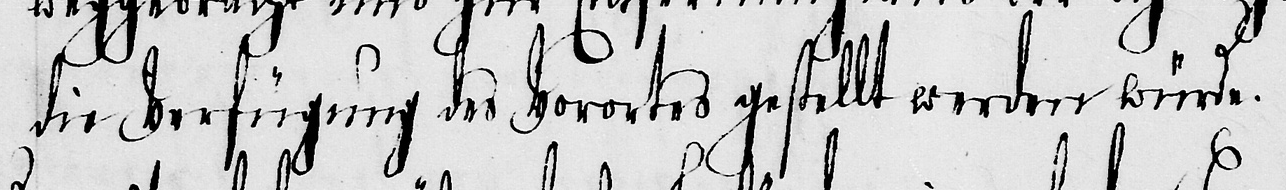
die Verfügung des Vorortes gestellt werden
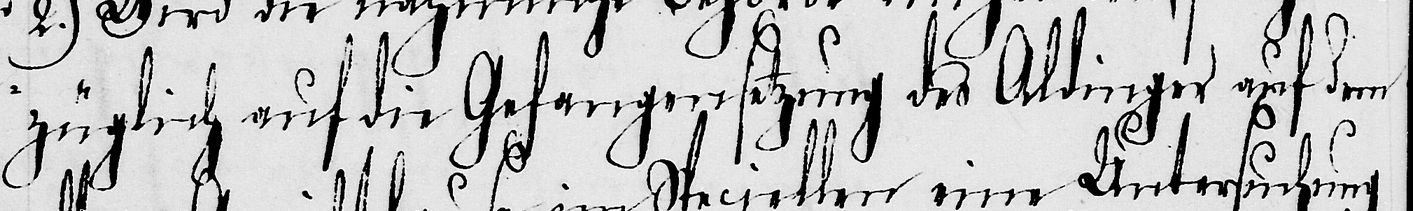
züglich auf die Gefangensetzung des Aldinger auf dem
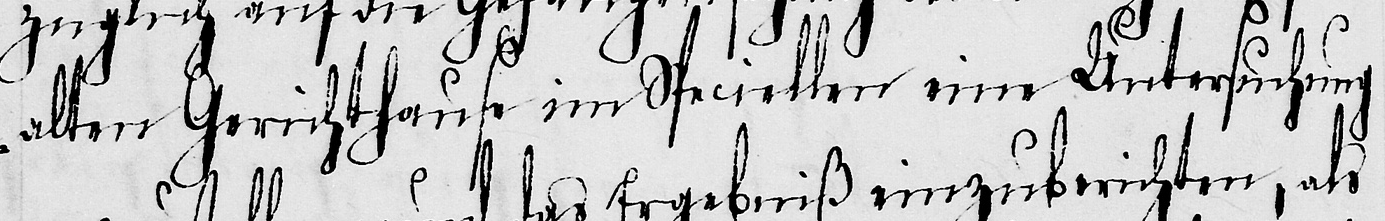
alten Gerichthause im Speciellen eine Untersuchung
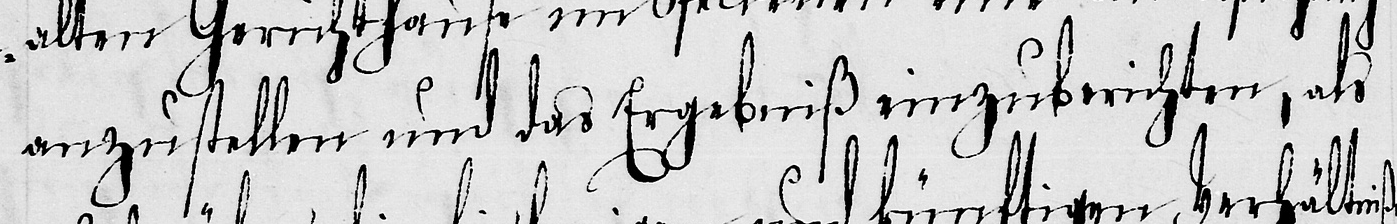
anzustellen und das Ergebniß einzuberichten, als
